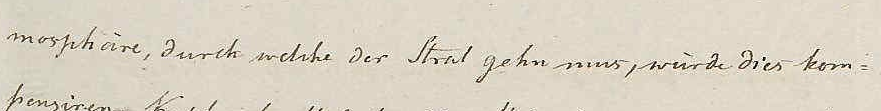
mosphäre, durch welche der Stral gehn mus, würde dies kom-
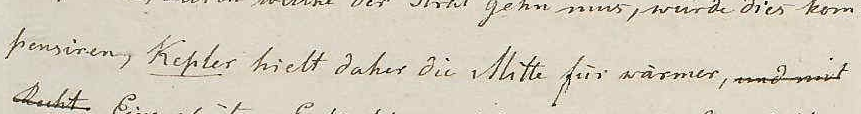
pensiren, Kepler hielt daher die Mitte für wärmer und mit
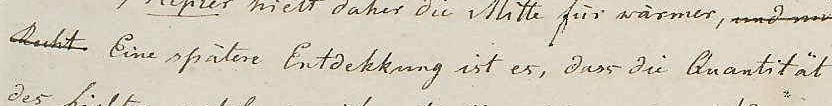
Recht. Eine spätere Entdekkung ist es, dass die Quantität
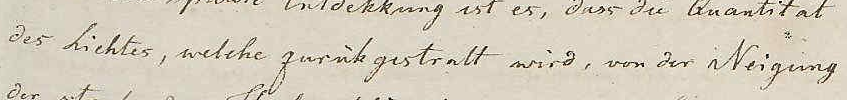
des Lichtes, welche zurükgestralt wird, von der Neigung
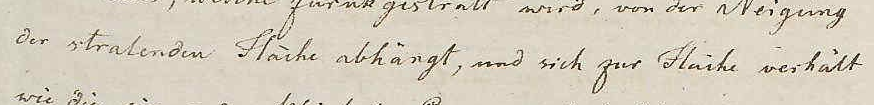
der stralenden Fläche abhängt, und sich zur Fläche verhält
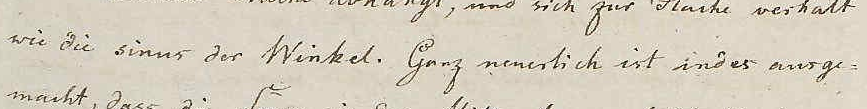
wie die sinus der Winkel. Ganz neuerlich ist indes ausge-
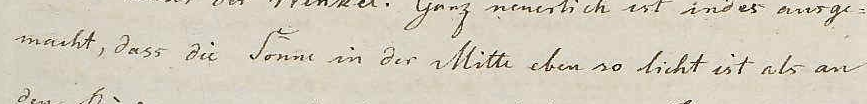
macht, dass die Sonne in der Mitte eben so licht ist als an
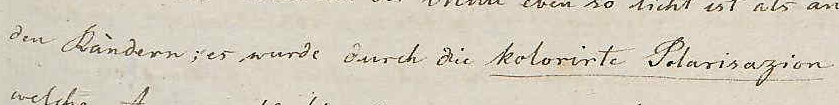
den Rändern; es wurde durch die kolorirte Polarisazion
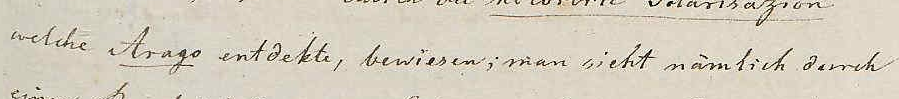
welche Arago entdekte, bewiesen; man sieht nämlich durch
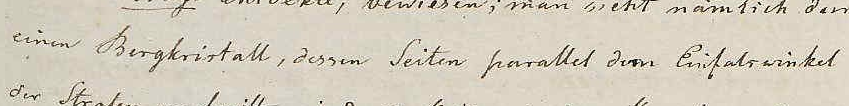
einen Bergkristall, dessen Seiten parallel derm Einfalswinkel
